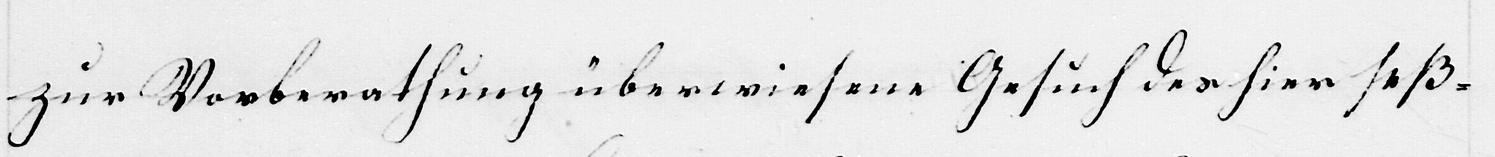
zur Vorberathung überwiesene Gesuch des hier seß¬
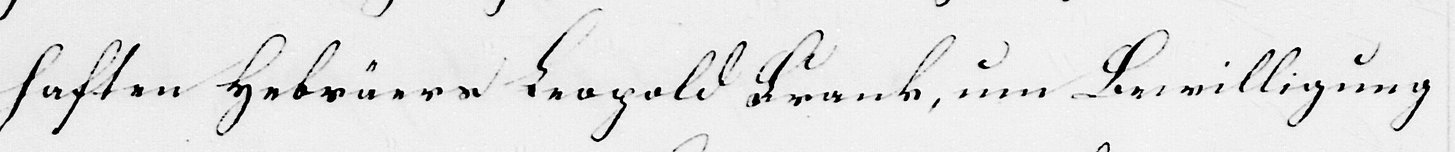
haften Hebräers Leopold Frank, um Bewilligung
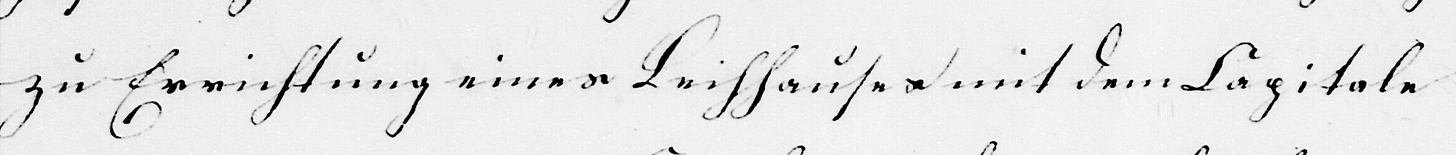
zu Errichtung eines Leihhauses mit dem Capitale
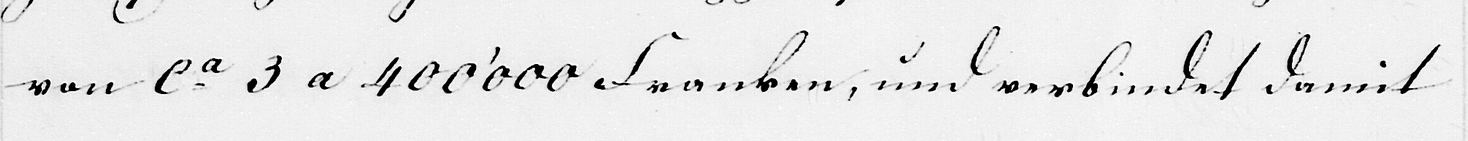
von Ca. 3 a 400‘000 Franken, und verbindet damit
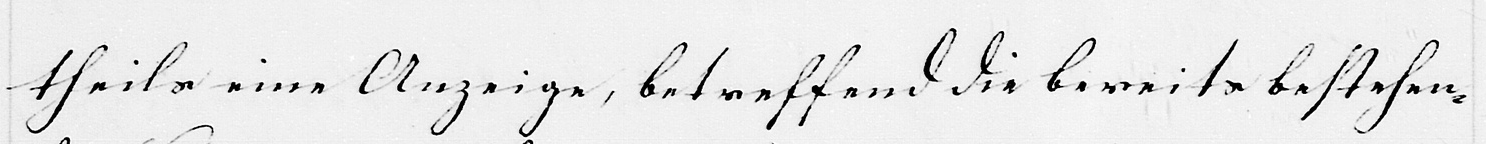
theils eine Anzeige, betreffend die bereits bestehen¬
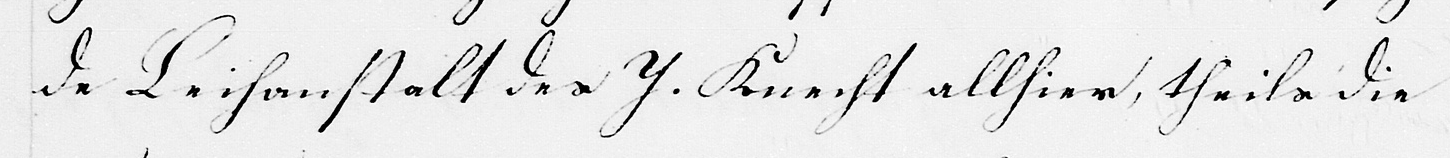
de Leihanstalt des J. Knecht allhier, theils die
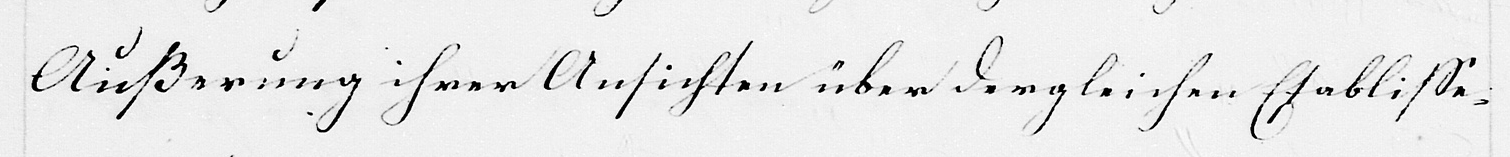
Außerung ihrer Ansichten über dergleichen Etabliße¬
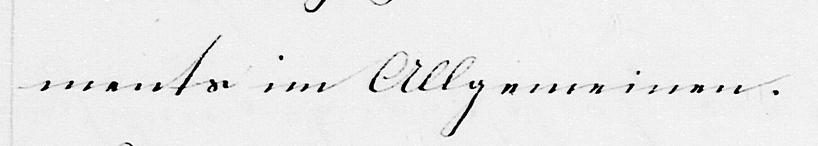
ments im Allgemeinen.
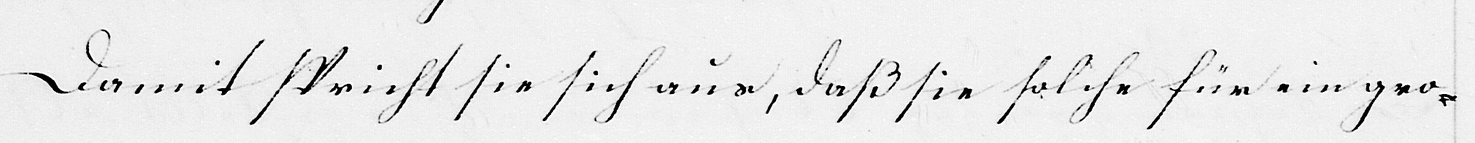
Damit spricht sie sich aus, daß sie solche für ein gro¬
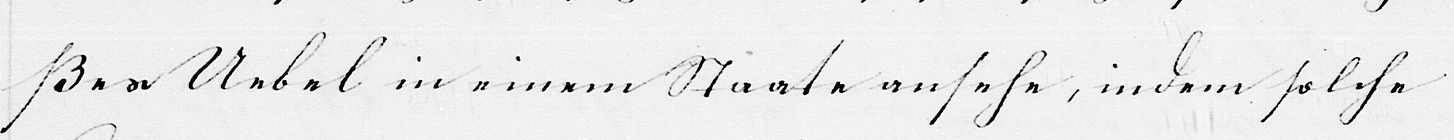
ßes Uebel in einem Staate ansehe, indem solche
